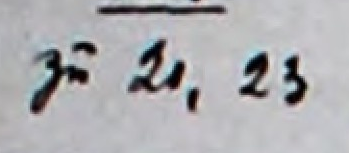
zu 21, 23
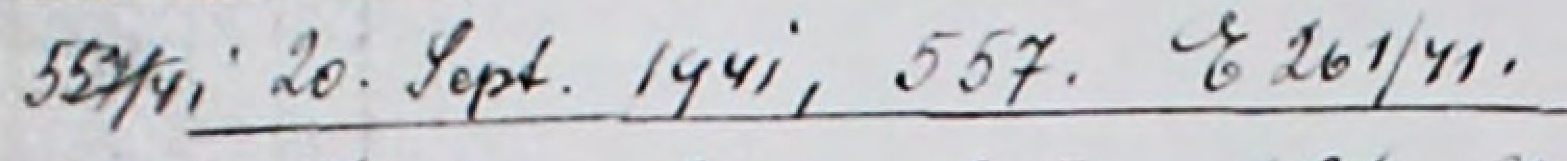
557/41 20. Sept. 1941, 557. E261/41.
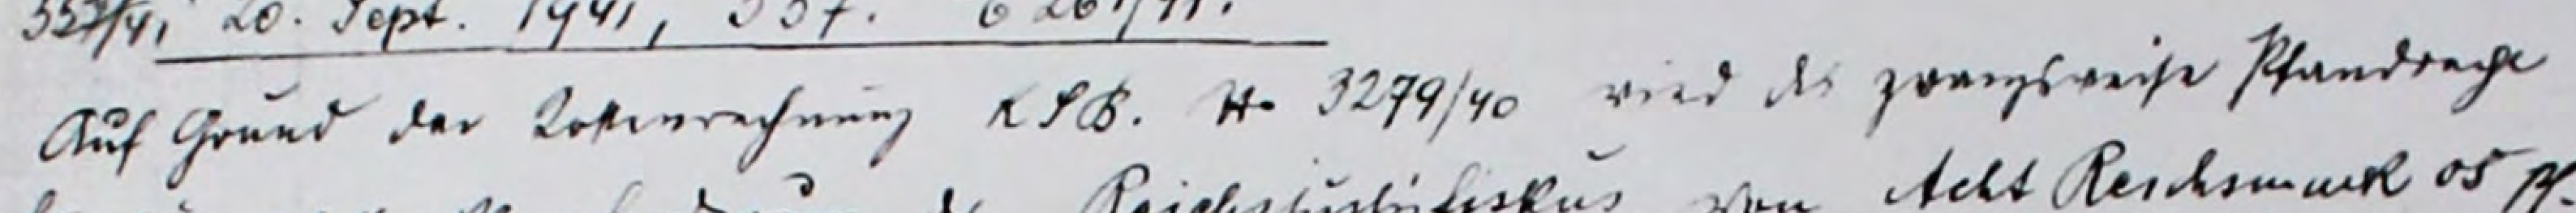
Auf Grund der Kostenrechnung K S B. No 3279/40 wird das zwangsweise Pfandrecht
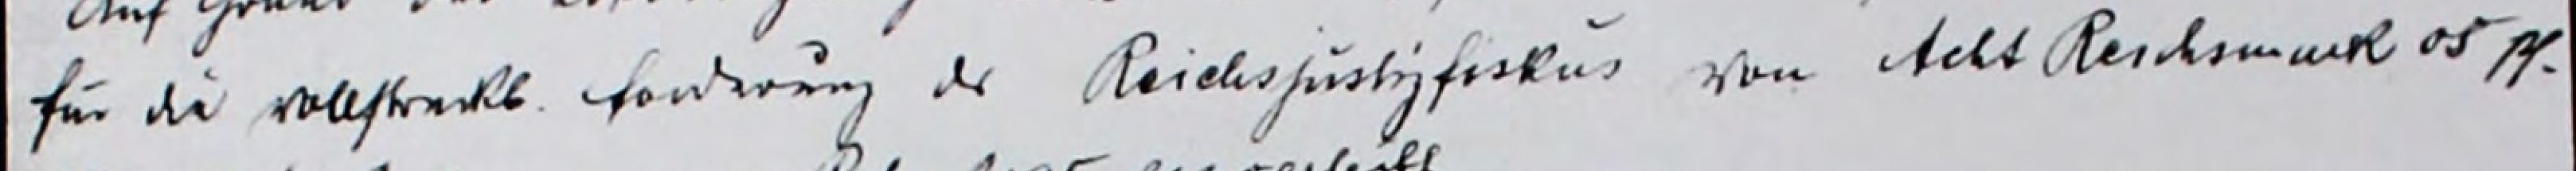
für die vollstreckb. Forderung des Reichshustigfiskus von Acht Reichsmark 05 14-
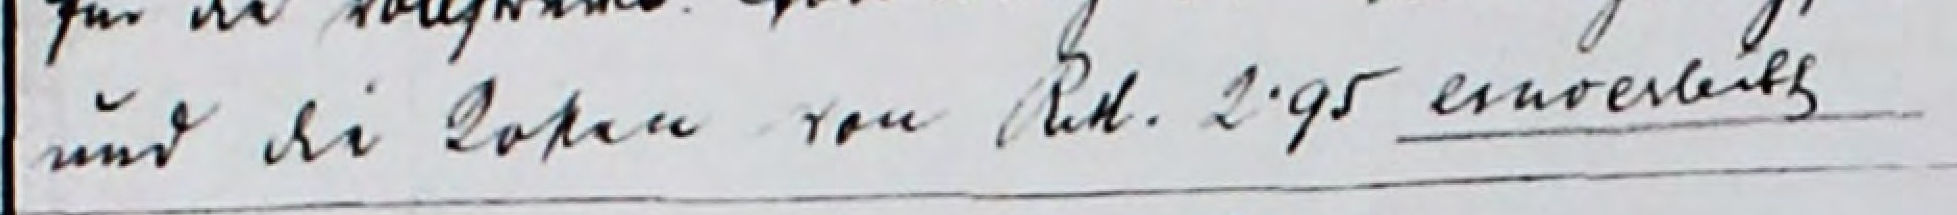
und die Kosten von Rm. 2.95 einverleibt
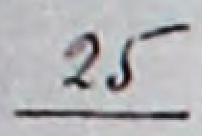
25
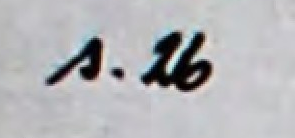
s. 26
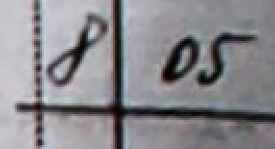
8 05
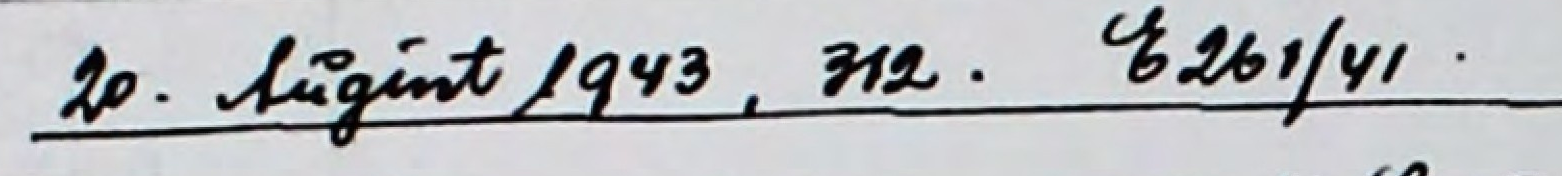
20. August 1943, 312. E 261/41.
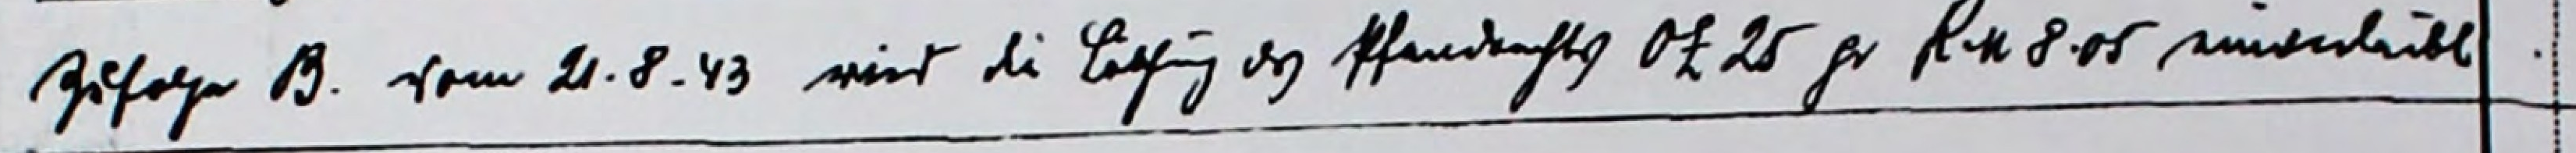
Zufolge B. vom 21.8.43 wird die Löschung des Pfandrechts OZ 25 pr Rm 8.05 einverleibt.
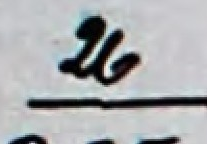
26
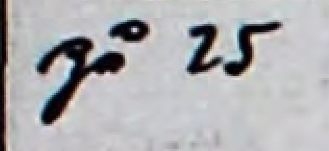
zu 25
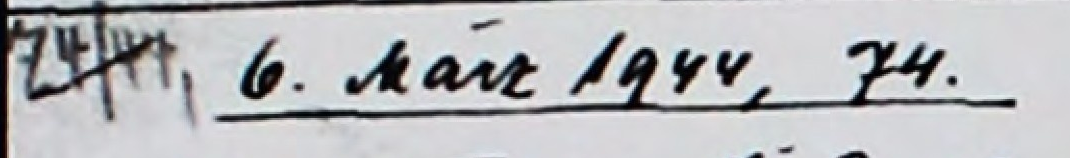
74/44 6. März 1944, 74.
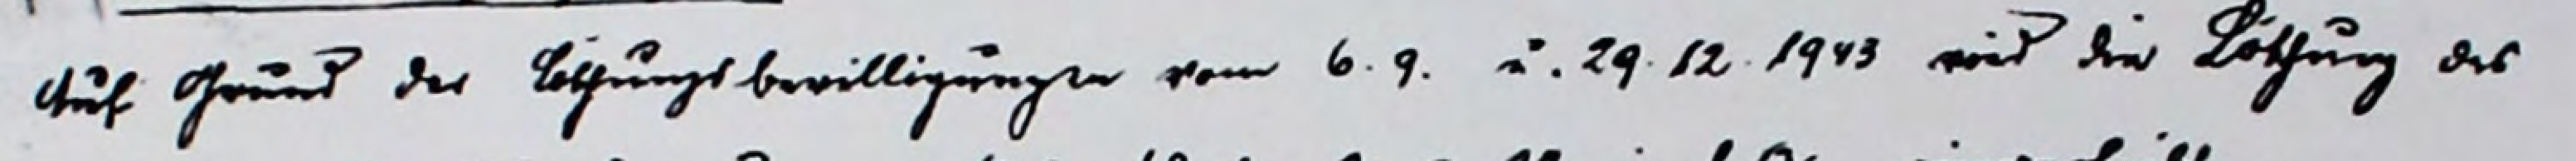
Auf Grund der Löschungsbewilligungen vom 6. 9. u. 29. 12. 1943 wird die Löschung des
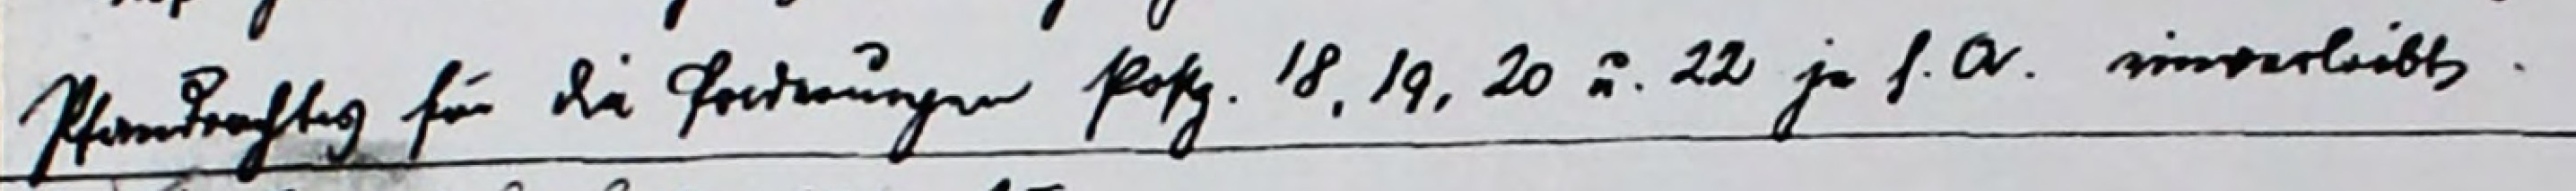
Pfandrechtes für die Forderungen Postz. 18, 19, 20 u. 22 je S.A. einverleibt.
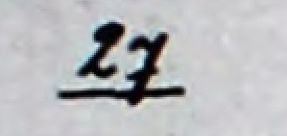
27
